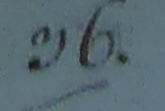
36.
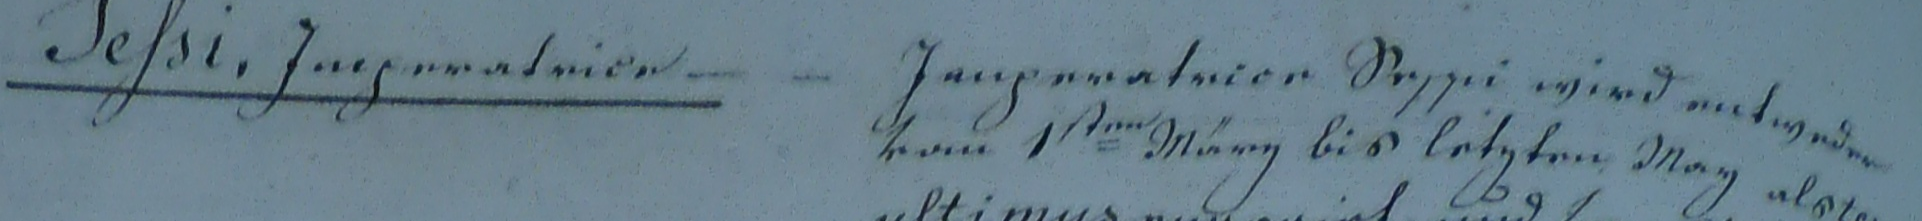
Sessi, Imperatrice _ _ Imperatrice Sessi wird entweder
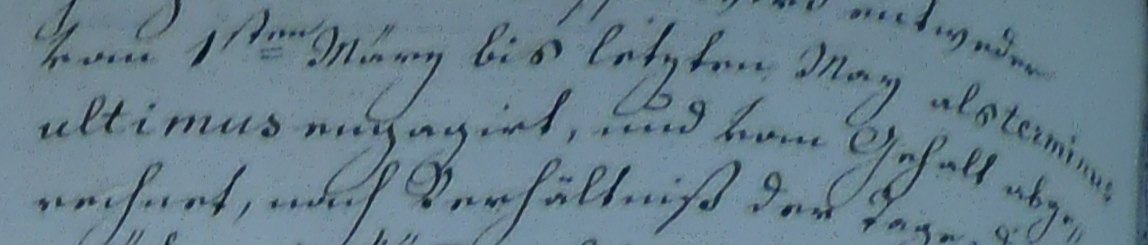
vom 1ste͇n März bis letzten May als terminus
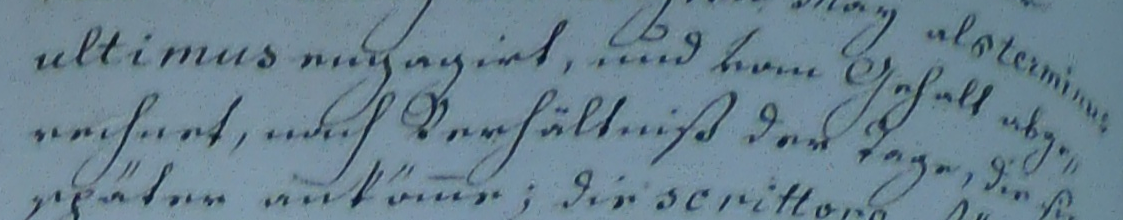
ultimus engagirt, und vom Gehalt abge¬
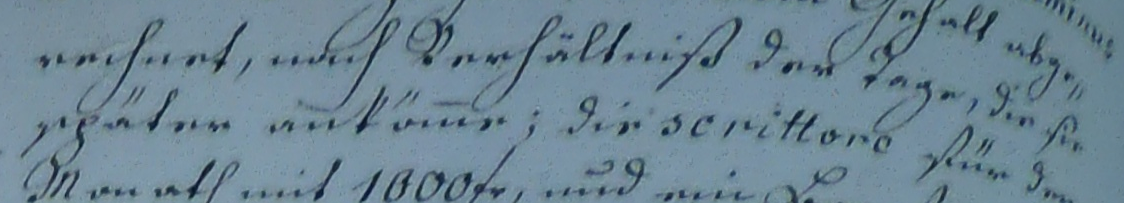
rechnet, nach Verhältniß der Tage, die sie
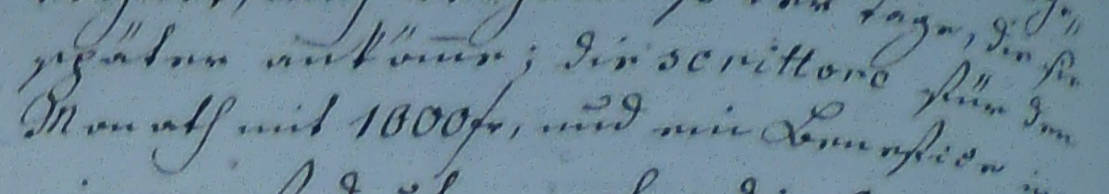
später anköm̅e; die scrittore für den
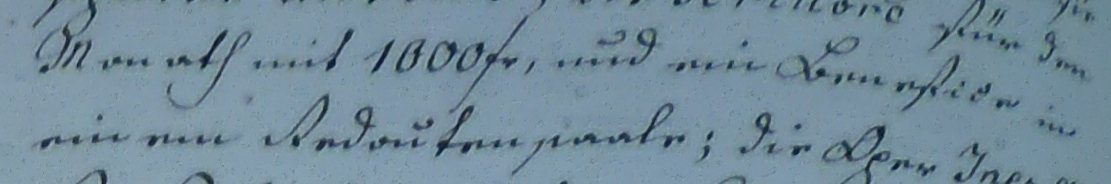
Monath mit 1000fr, und ein Benefice in
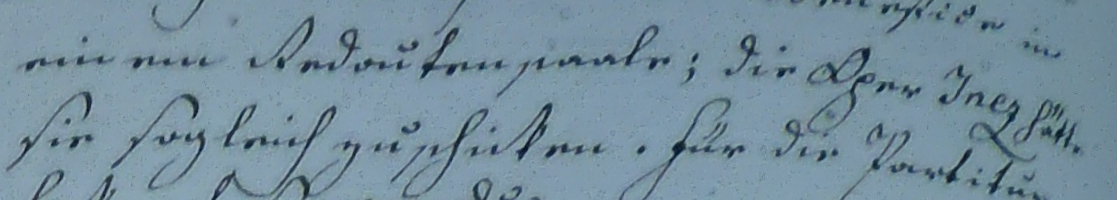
einem Redoutensaale; die Oper Inez hätte
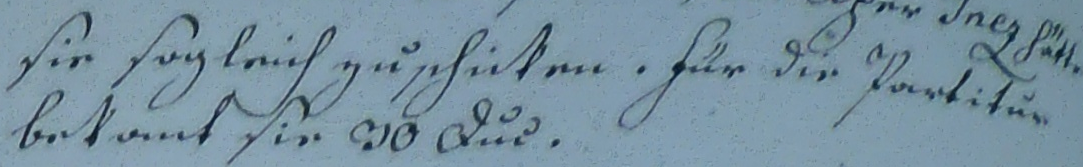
sie sogleich zuschicken. Für die Partitur
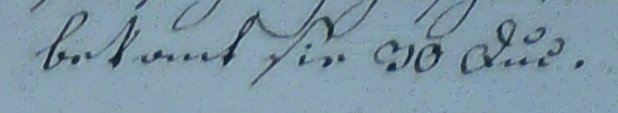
bekomt sie 30 Duc.
